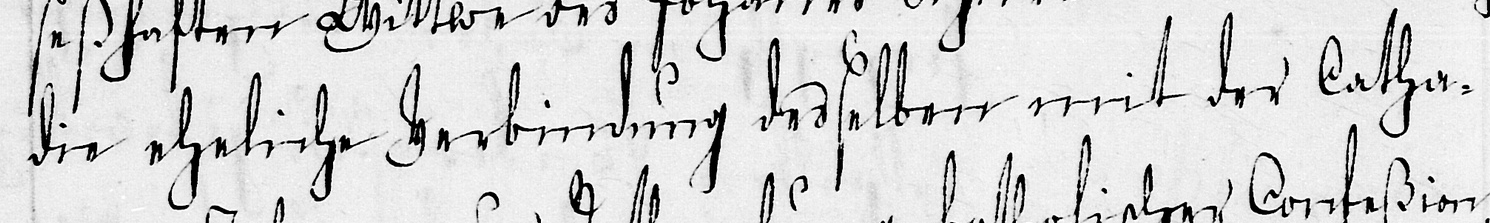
die eheliche Verbindung desselben mit der Catha¬
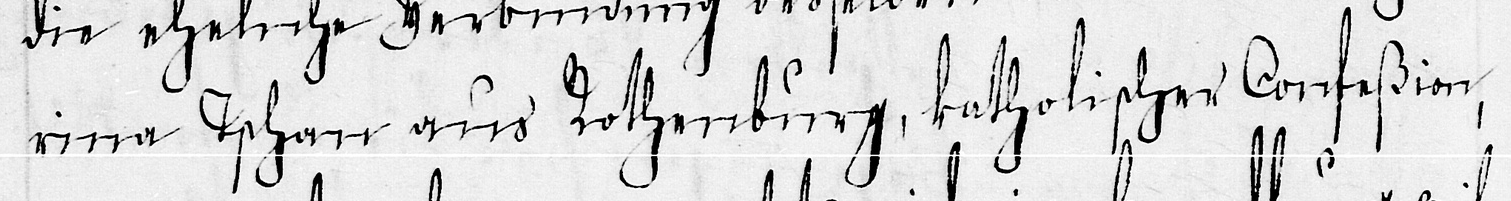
rina Tschan aus Rothenburg, katholischer Confeßion,
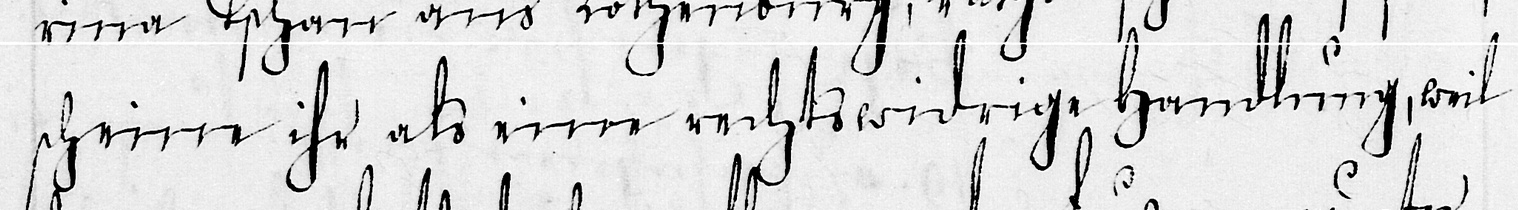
scheine ihr als eine rechtswidrige Handlung, weil
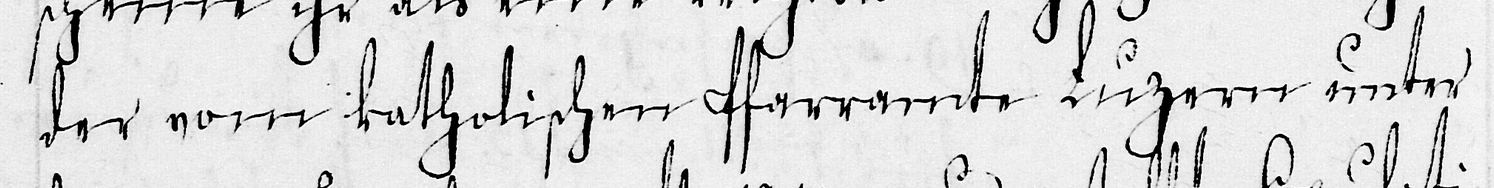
der vom katholischen Pfarramte Luzern unter
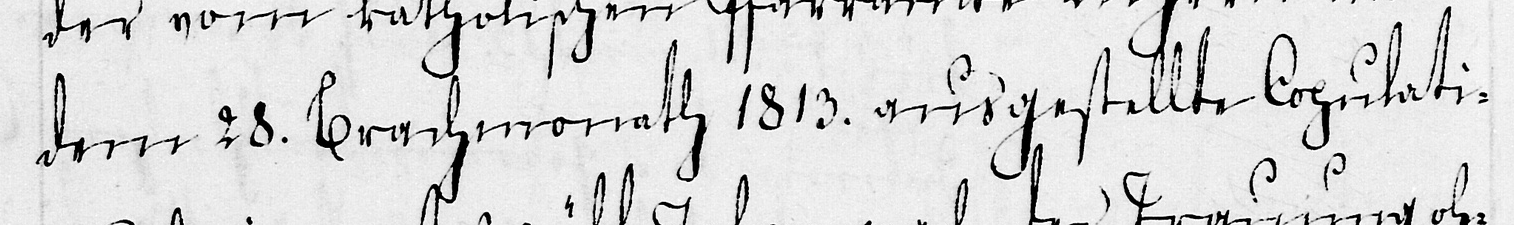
dem 28. Brachmonath 1813. ausgestellte Copulati¬
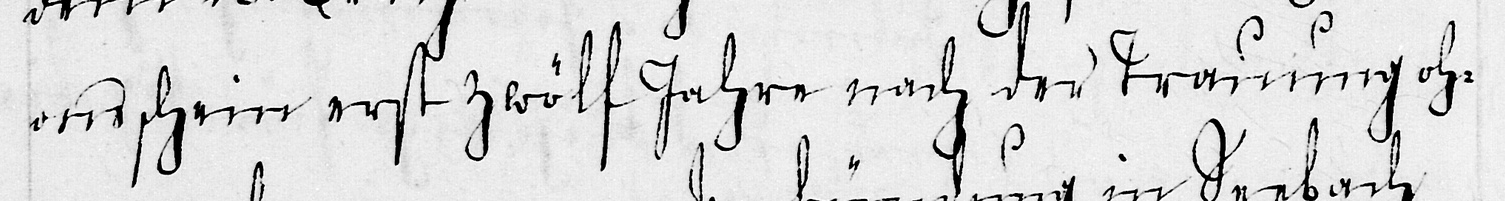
onsschein erst zwölf Jahre nach der Trauung oh¬
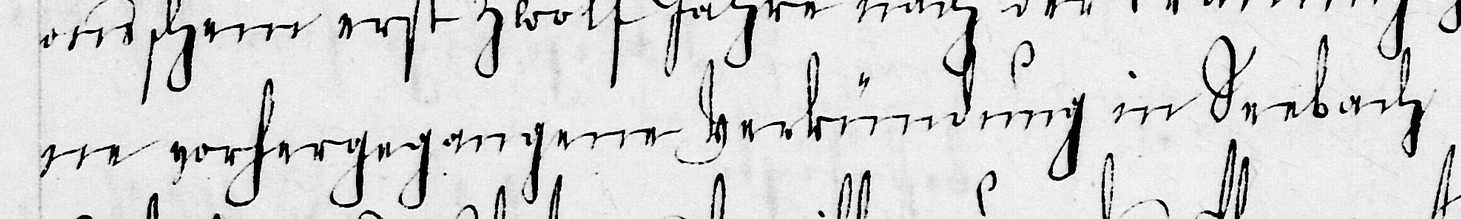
ne vorhergegangene Verkündung in Seebach
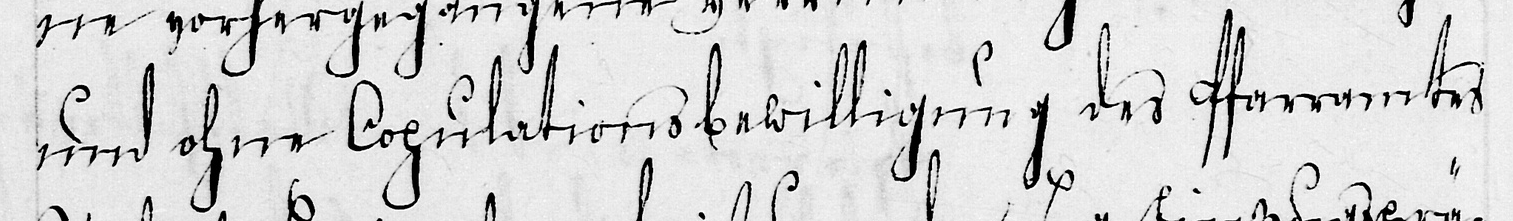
und ohne Copulationsbewilligung des Pfarramtes
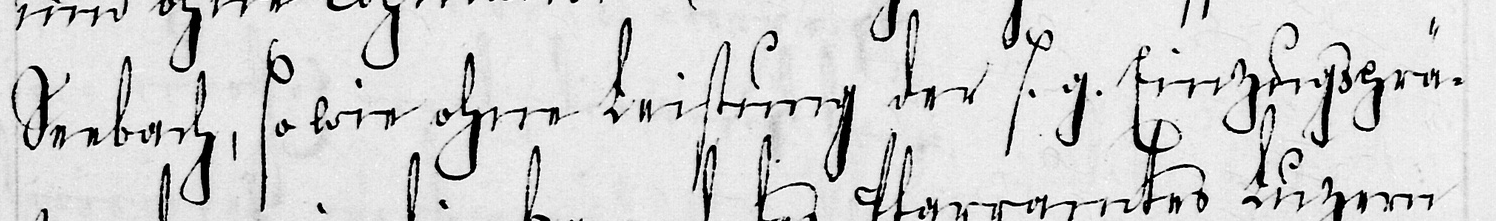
Seebach, sowie ohne Leistung der s. g. Einzugsprä¬
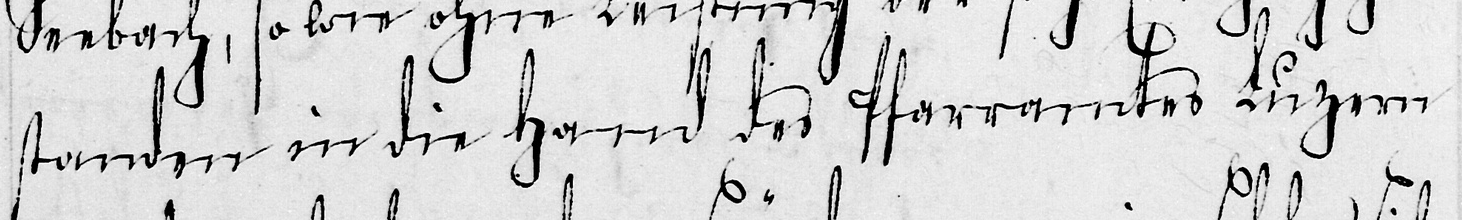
standen in die Hand des Pfarramtes Luzern
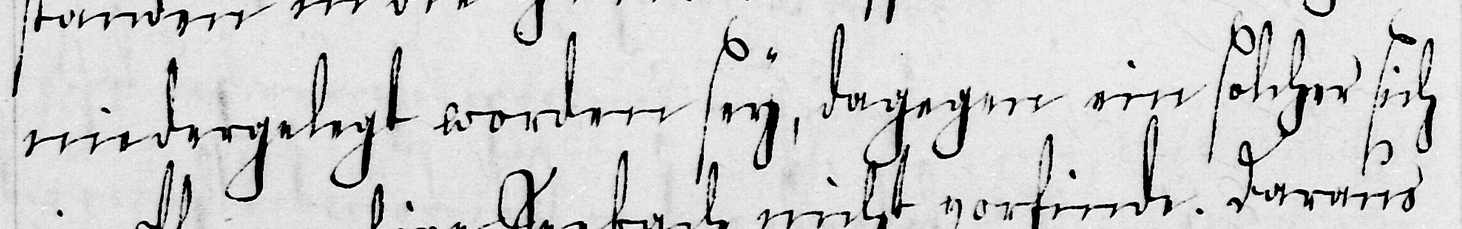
niedergelegt worden sey, dagegen ein solcher sich
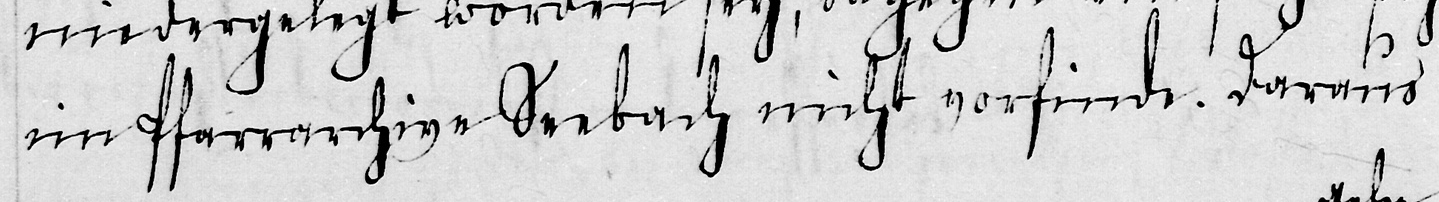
im Pfarrarchive Seebach nicht vorfinde. Daraus
